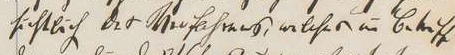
sichtlich des Verfahrens, welches im Betreff
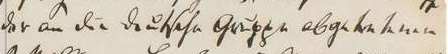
der an die deutsche Gruppe abgetretenen
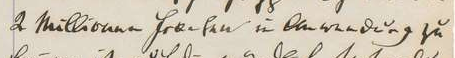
2 Millionen Franken in Anwendung zu
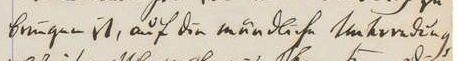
bringen ist, auf die mündliche Unterredung,
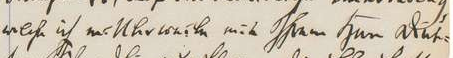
welche ich mittlerweile mit Ihrem Herr Direk-
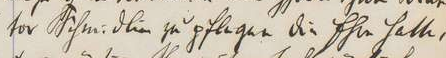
tor Schmidlin zu pflegen die Ehre hatte,
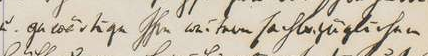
u. gewärtige Ihre weitern sachbezüglichen
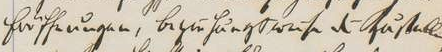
Eröffnungen, beziehungsweise die Zustellung
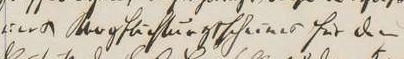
eines Verpflichtungsscheines für den
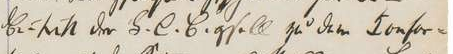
Beitritt der S.C.B.gsell. zu dem Consor-
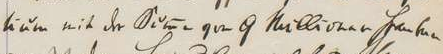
tium mit der Summe von 9 Millionen Franken
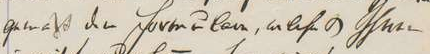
gemäß dem Formulare, welches Ihnen
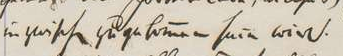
inzwischen zugekommen sein wird.
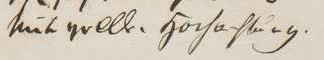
Mit vollk. Hochachtung.
